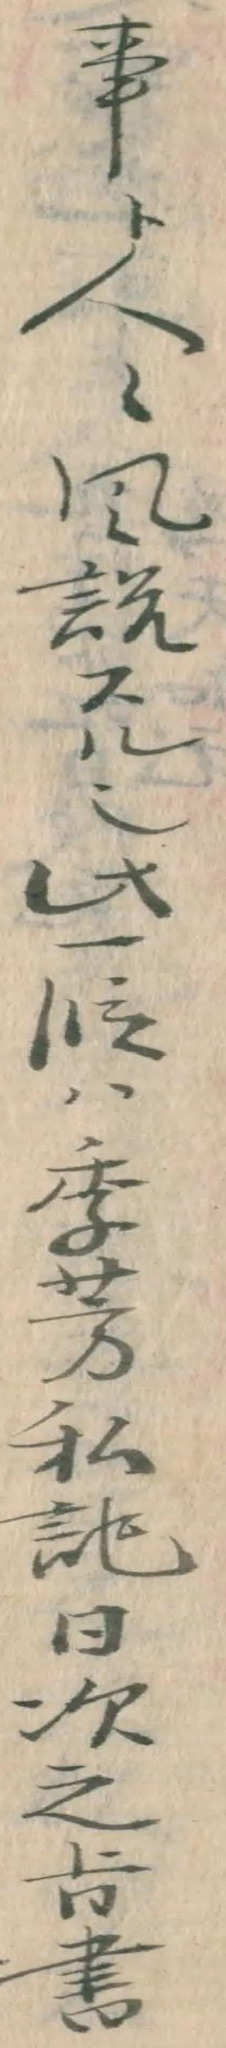事ト人々風説スル也此一段ハ季芳私記日次之旨書
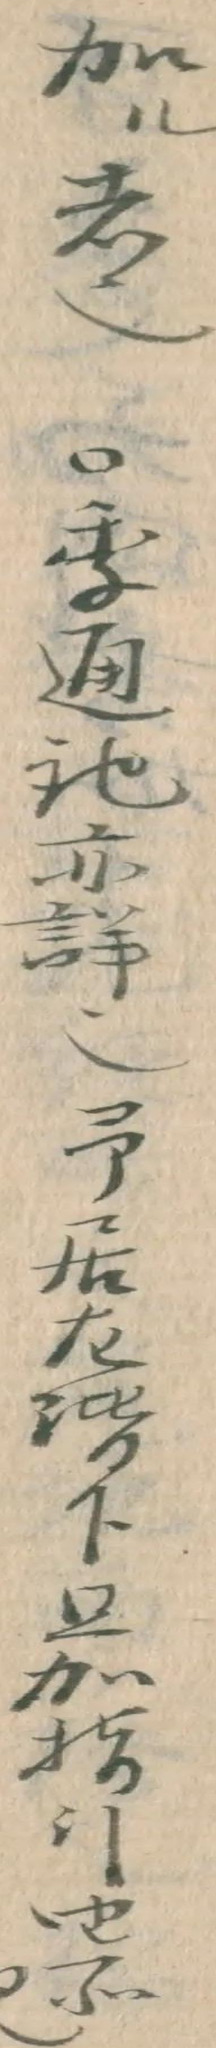加ル者也〇季通記亦詳也予居左階下且加指引由所見
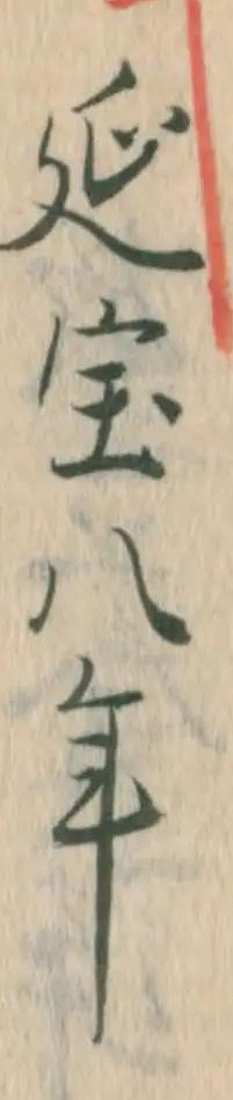延宝八年
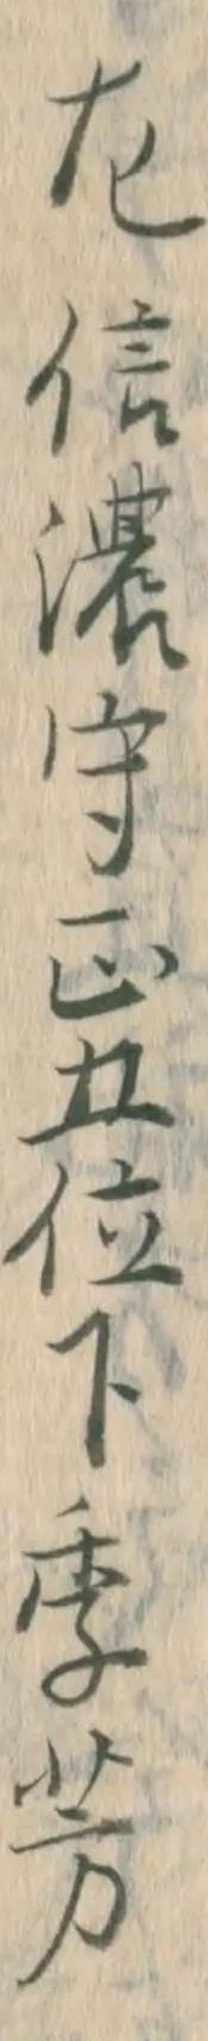左信濃守正五位下季芳
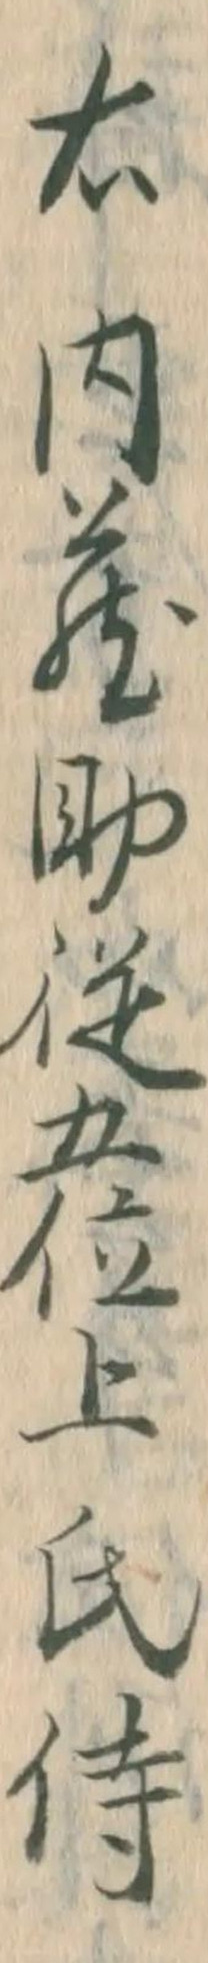右内蔵助従五位上氏侍
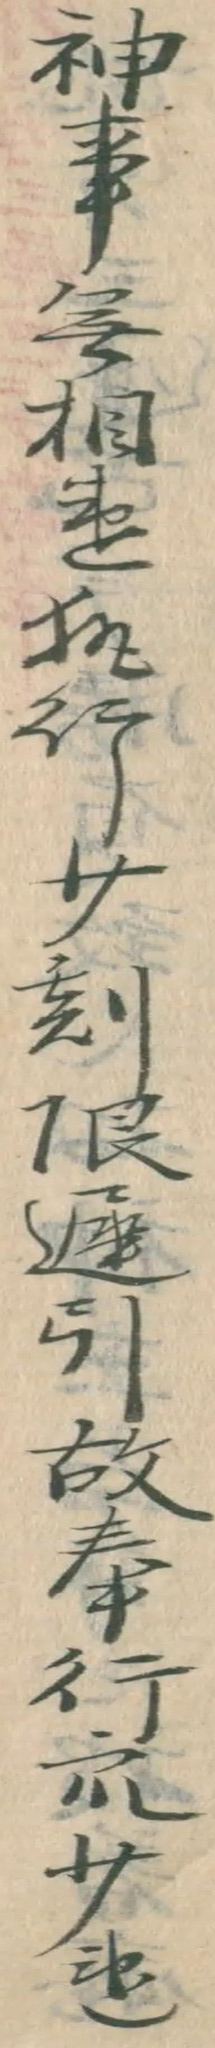神事無相違執行少刻限遅引故奉行衆少遅

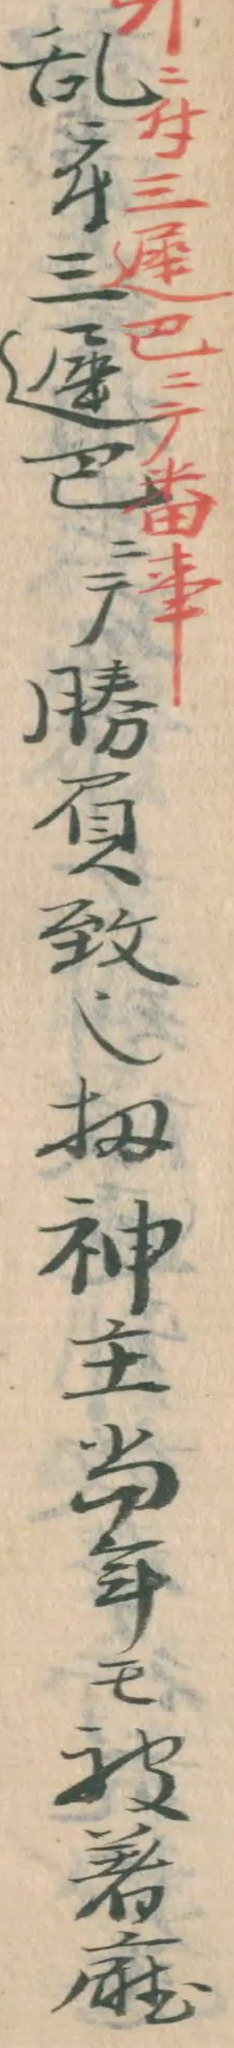乱ニ付三遅巴ニテ勝負致也扨神主当年モ被着庁
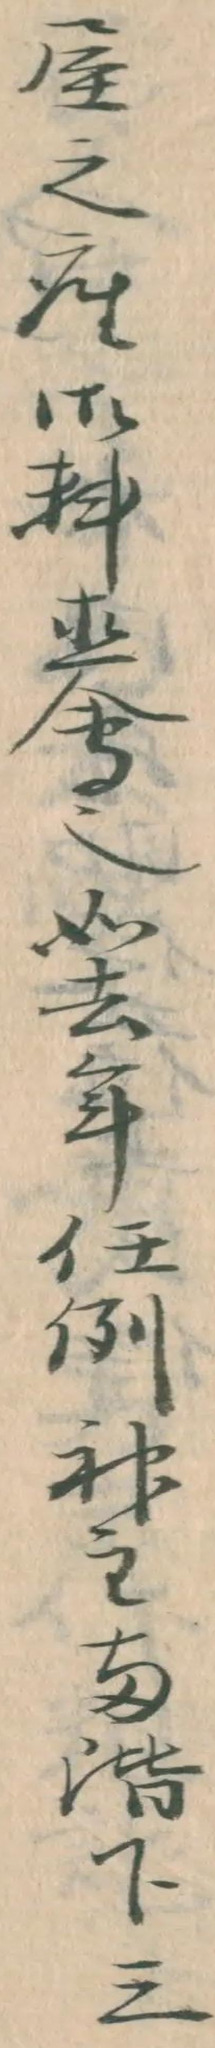屋之座御料直会也如去年任例神主両階下三
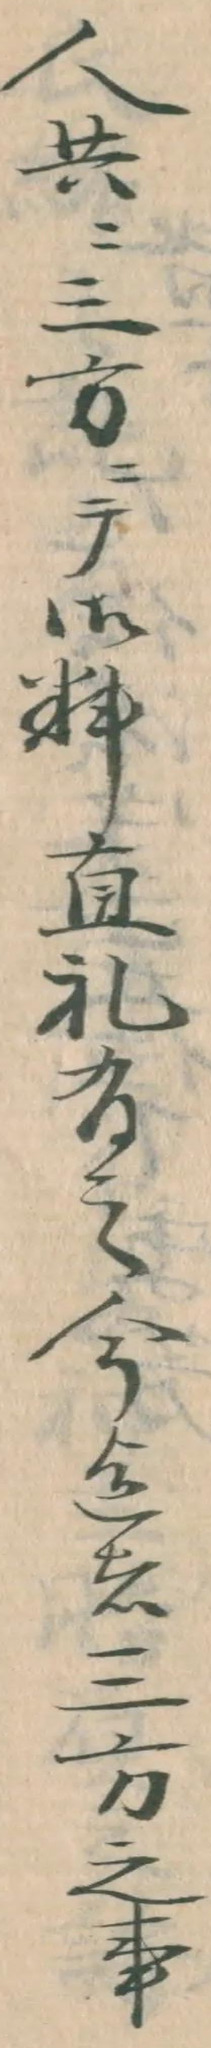人共ニ三方ニテ御料直礼有之今迄者三方之事
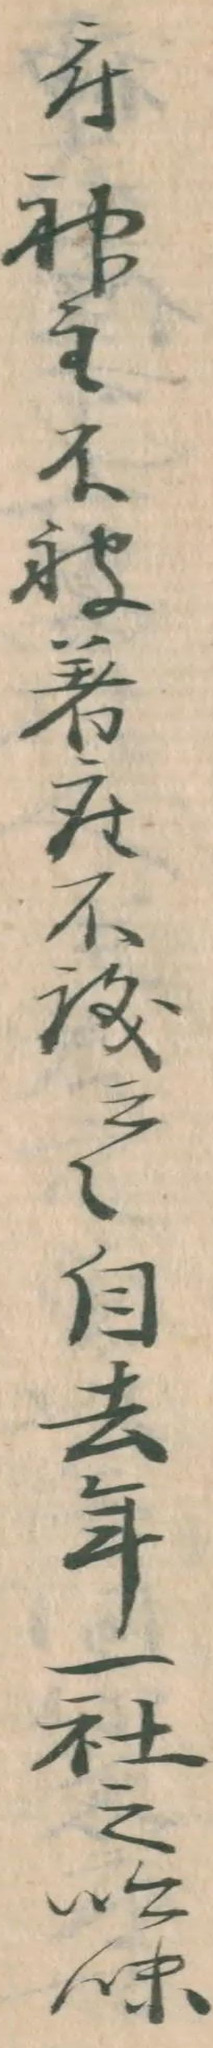ニ付神主不被着座不議云々自去年一社之吟味
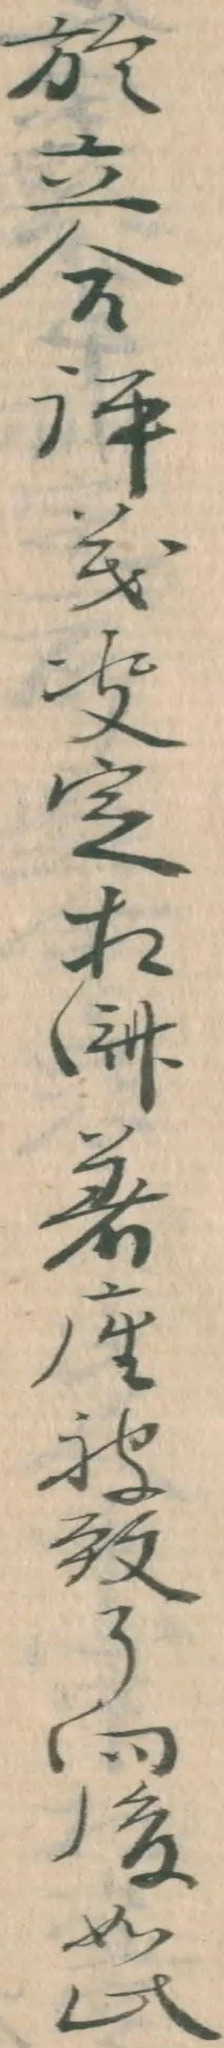於立合評義決定相済着座被致了向後如此
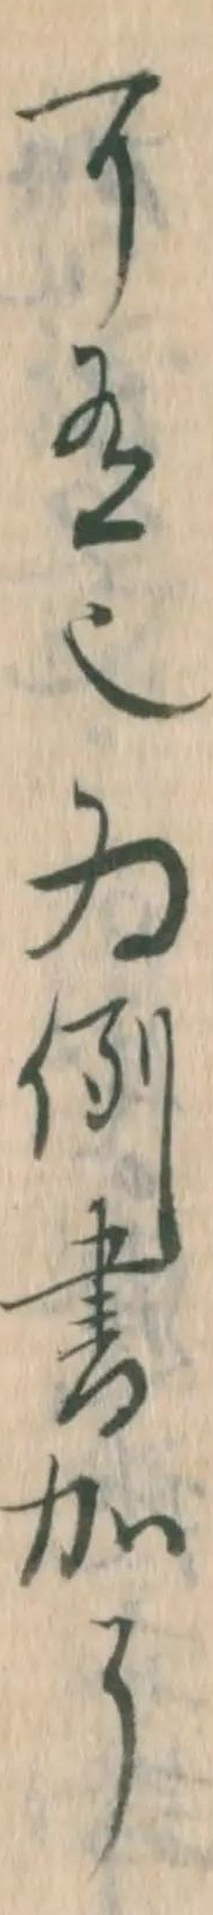可有也為例書加了
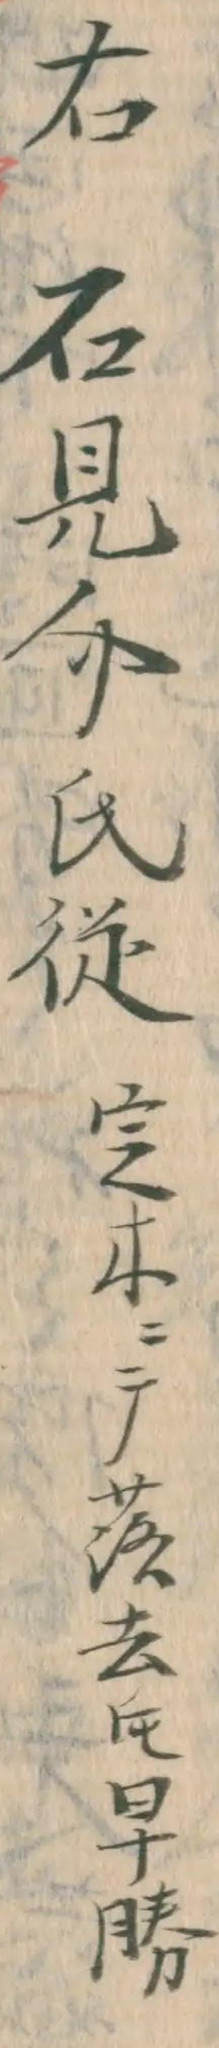右石見介氏従定木ニテ落去トモ早勝
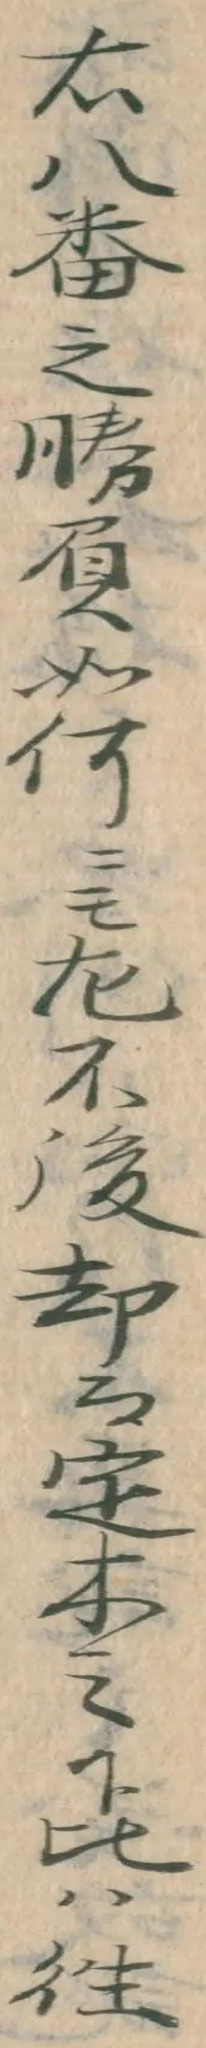右八番之勝負如何ニモ左不後却而定木之下比ハ往
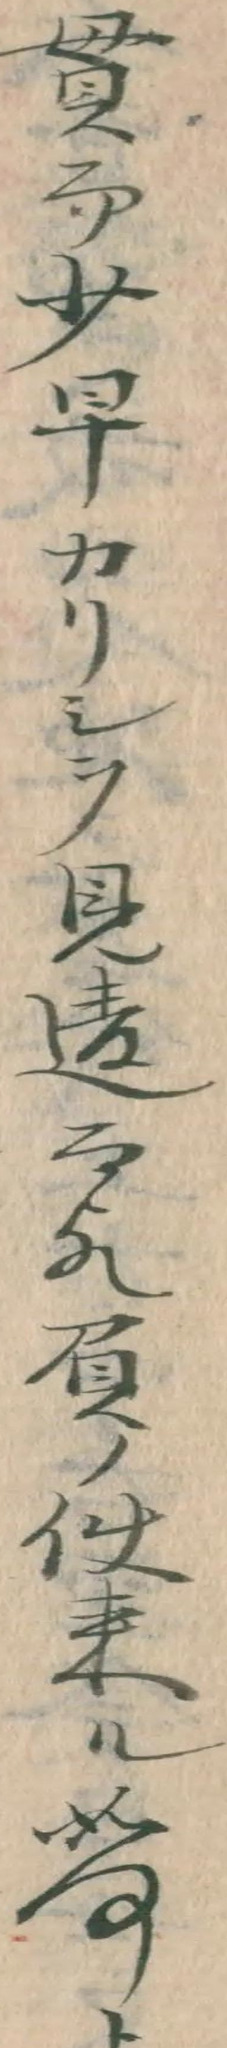貫而少早カリシヲ見違而歟負ノ使来ル如何ト
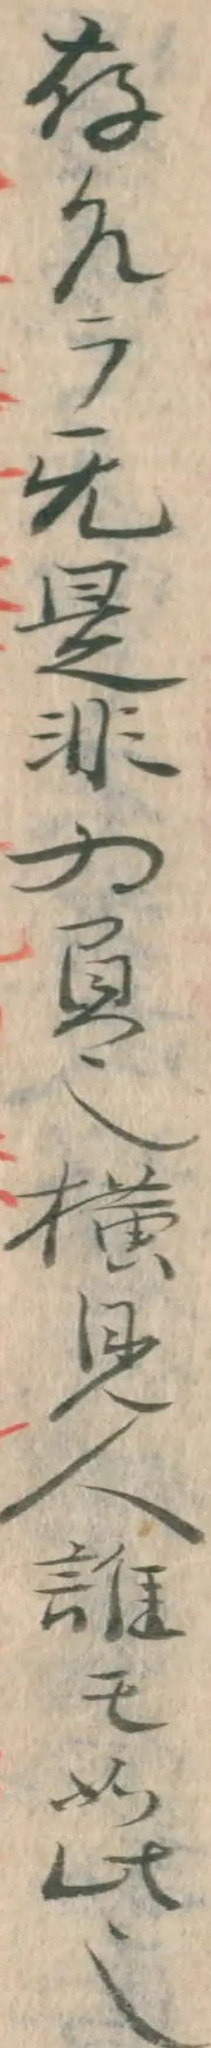存候ヲ无是非為負也横見人誰モ如此也
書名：賀茂社記録. 第10冊
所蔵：国立国会図書館 National Diet Library, JAPAN
